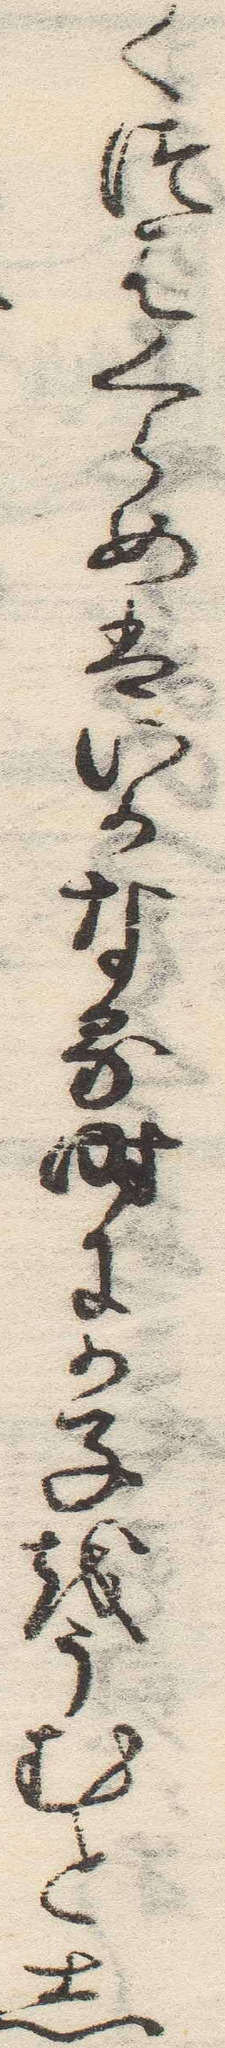くつはくらめはいかなる時にか子をうむとし
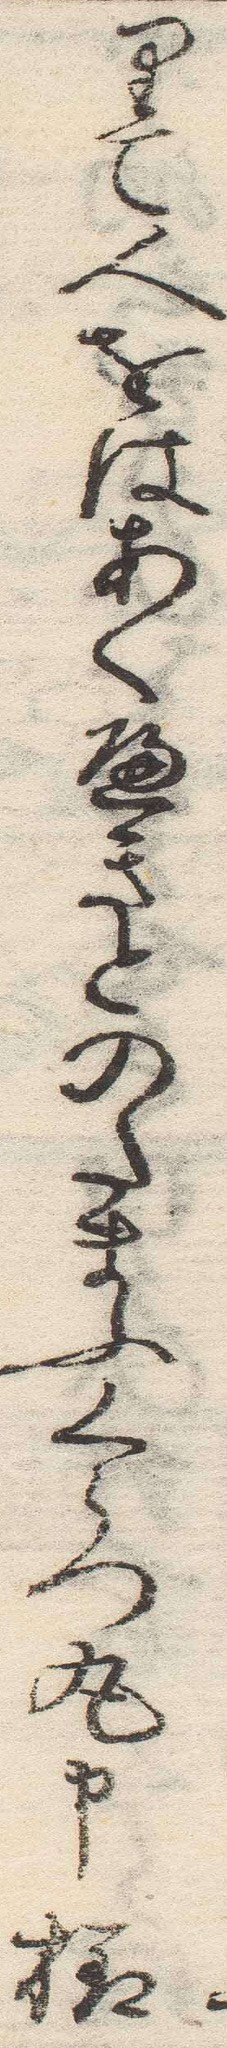りて人をはあくへきとのたまふくらつ丸申様
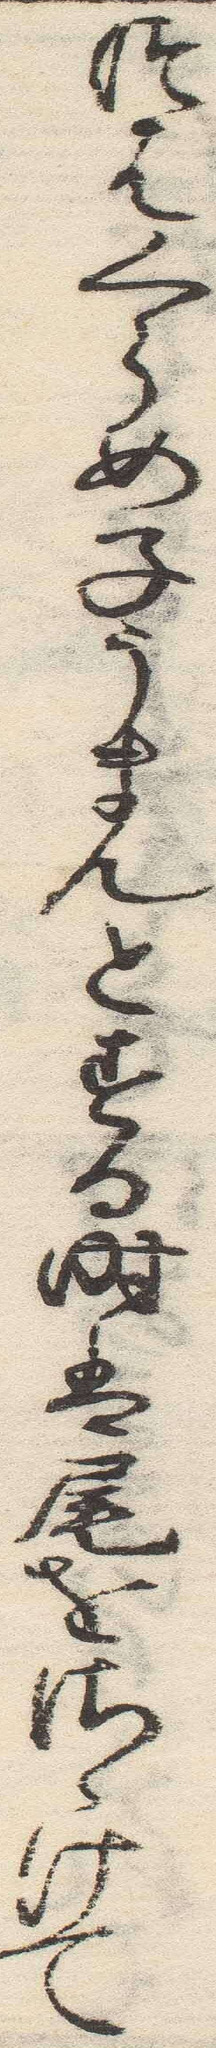つはくらめ子うまんとする時は尾をさゝけて
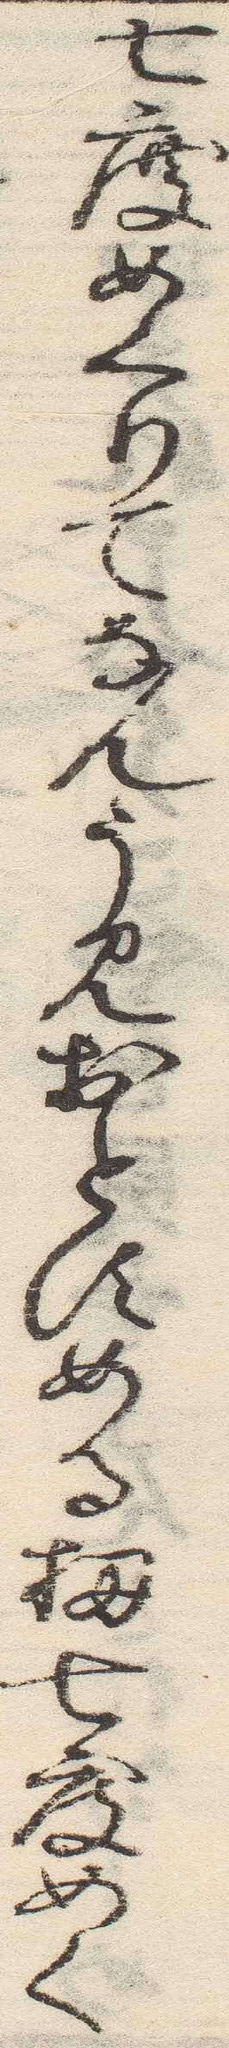七度めくりてなんうみおとすめる扨七度めく
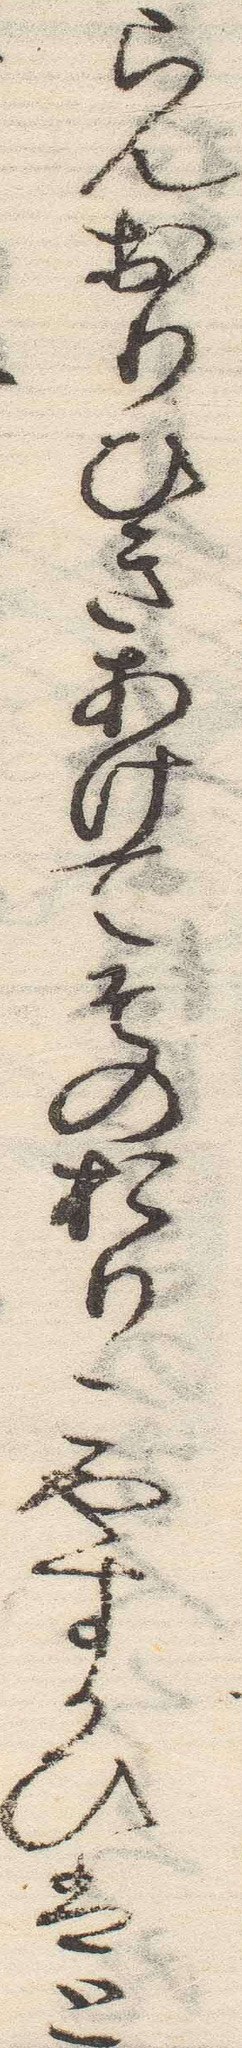らんおりひきあけてそのおりこやすかひはと
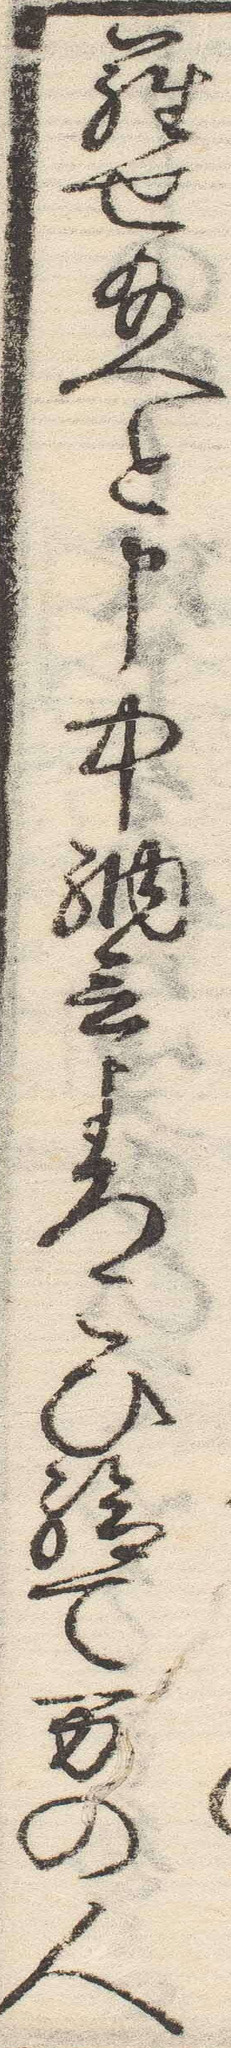らせ給へと申中納言よろこひ給て万の人
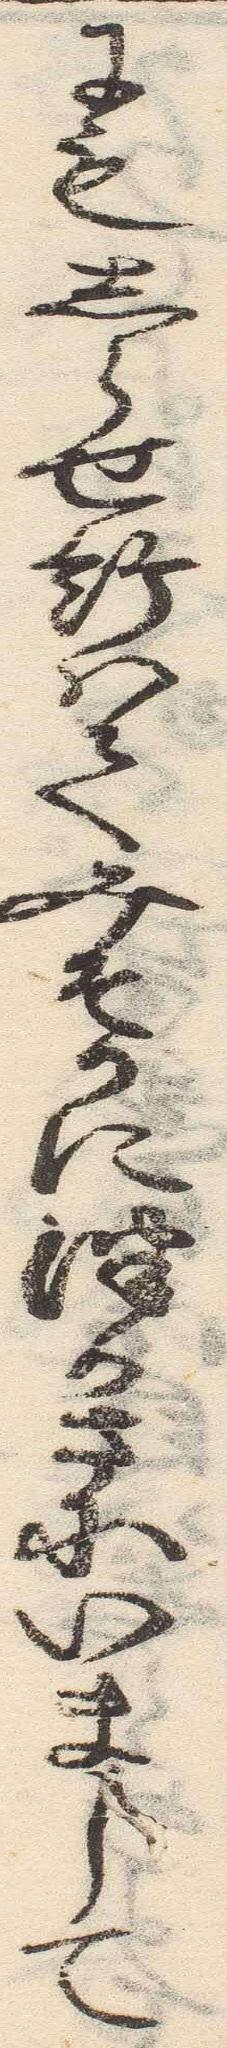にもしらせ給はてみそかにつかさにいまして
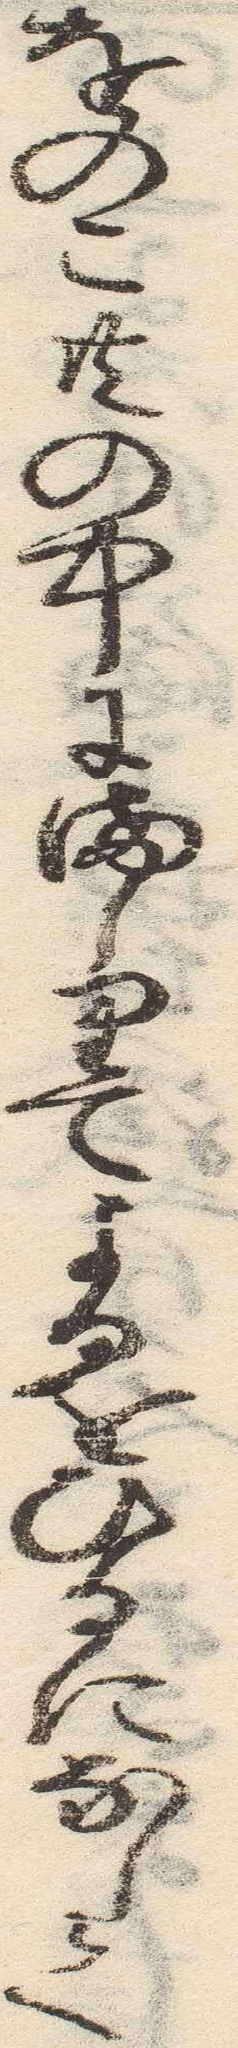をのこ共の中にましりてよるをひるになして
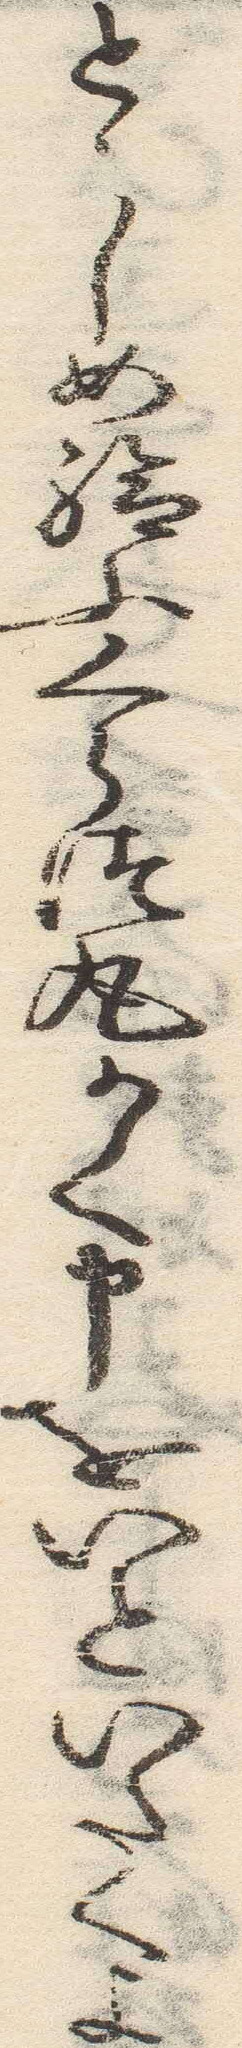とらしめ給ふくらつ丸かく申をいといたくよ
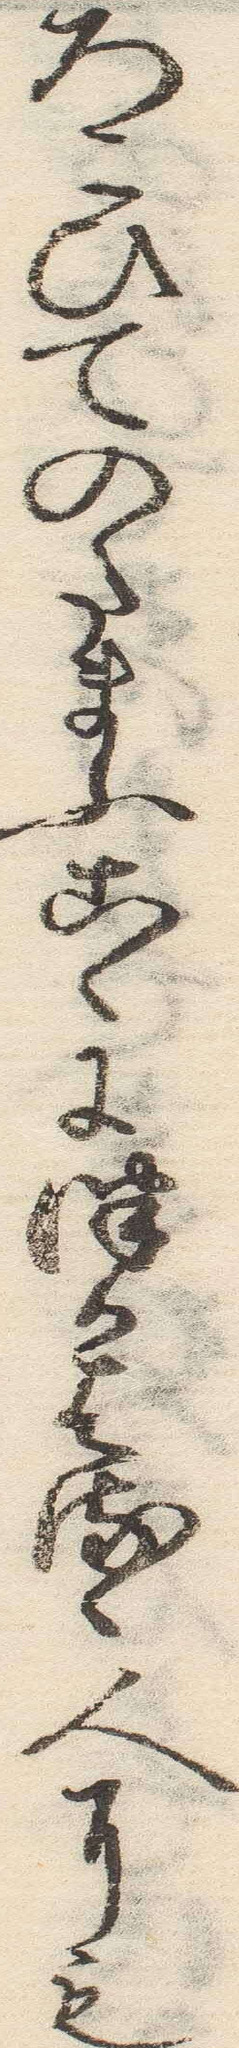ろこひてのたまふこゝにつかはるゝ人にも
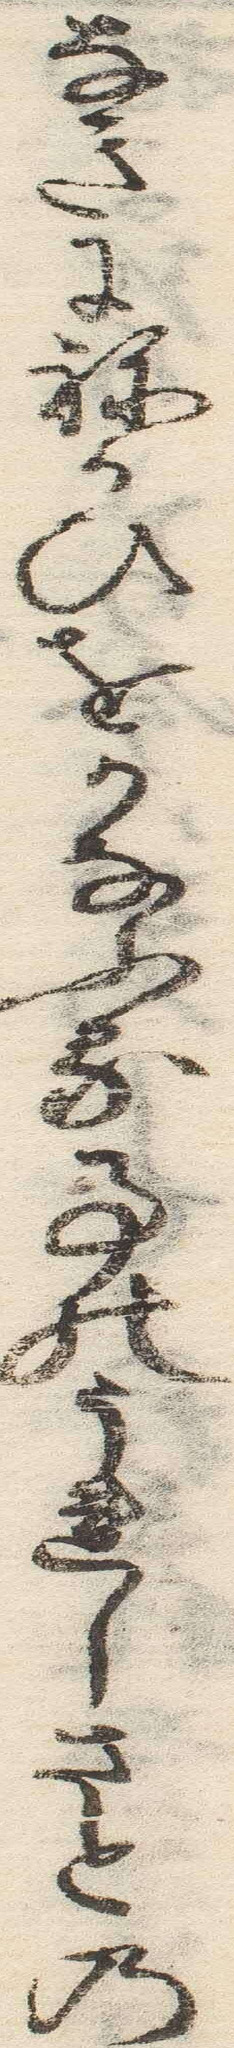なきにねかひをかなふる事のうれしさとの
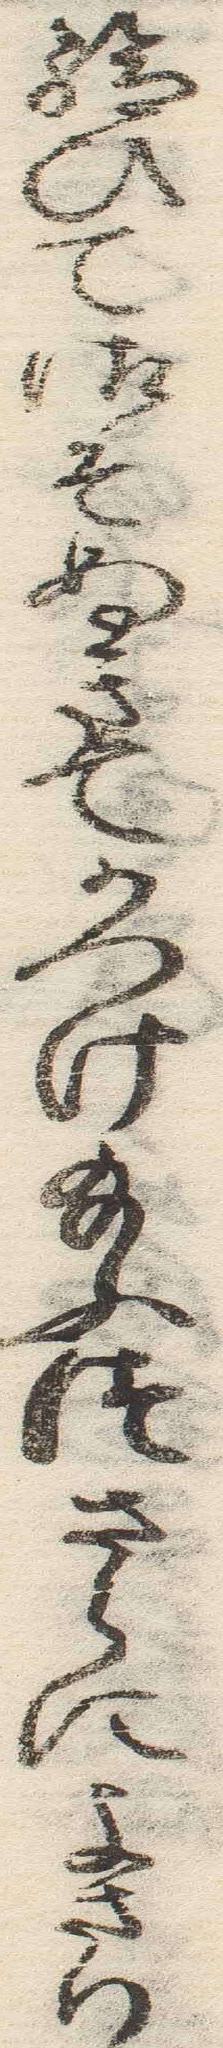給ひて御そぬきてかけつけ給ふつさらによさり
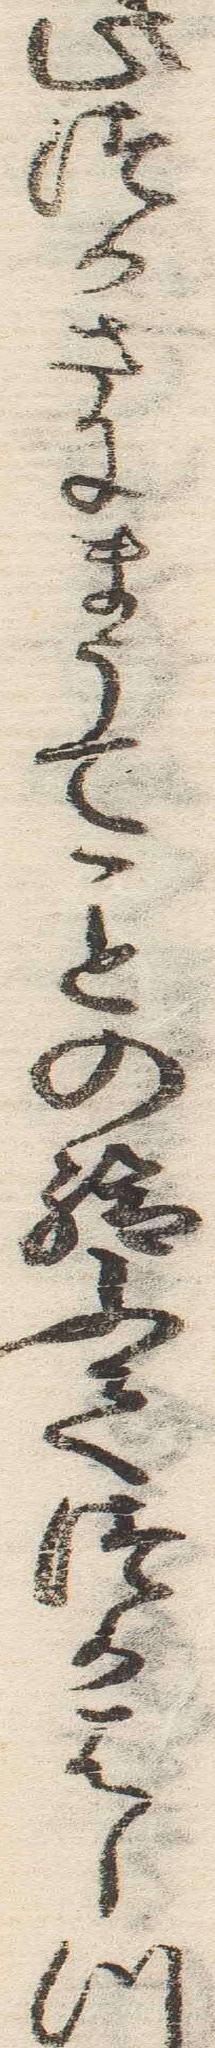此つかさにまうてことの給ふてかはしつ
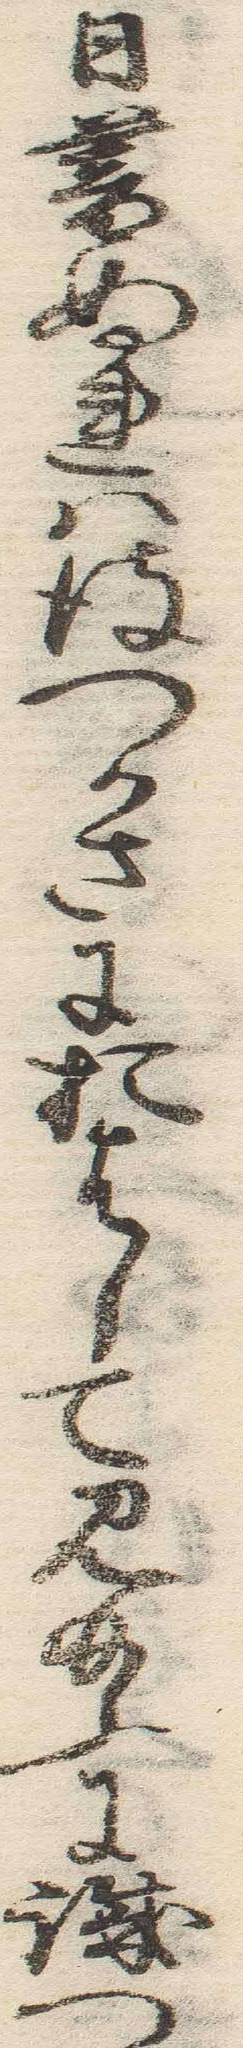日暮ぬれは彼つかさにおはして見給ふに誠つ
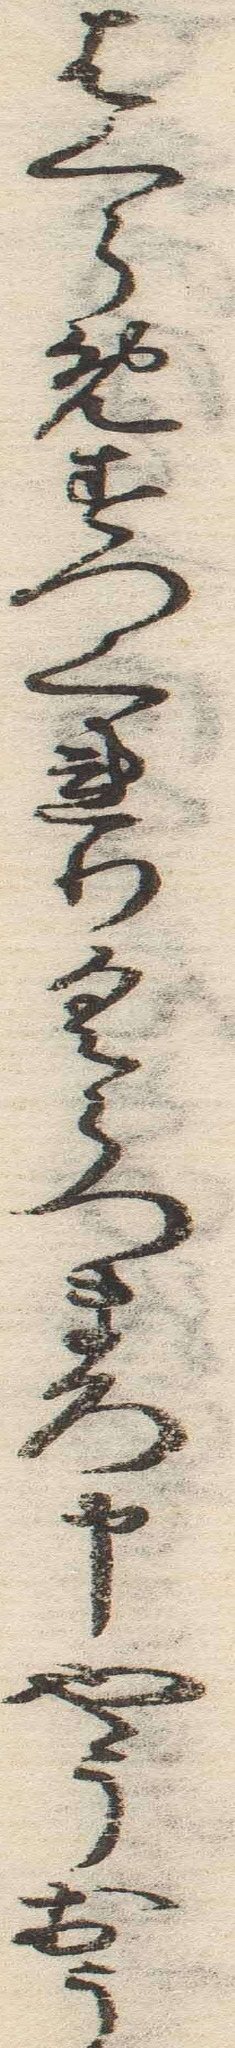はくらめすつくれりくらつまろ申やうおう
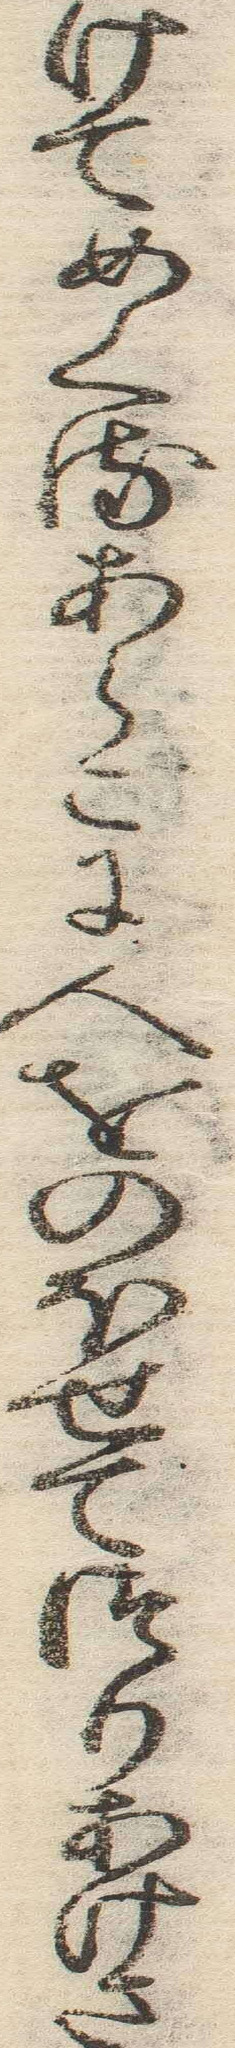けてめくるあらこに人をのほせてつりあけさ
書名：竹取物語
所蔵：東京学芸大学附属図書館 国文学研究資料館
